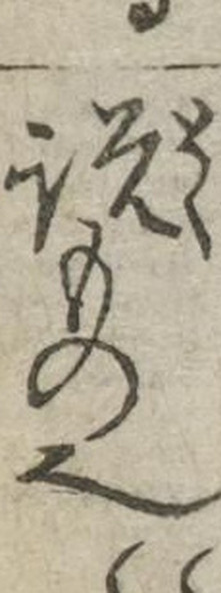説もの也

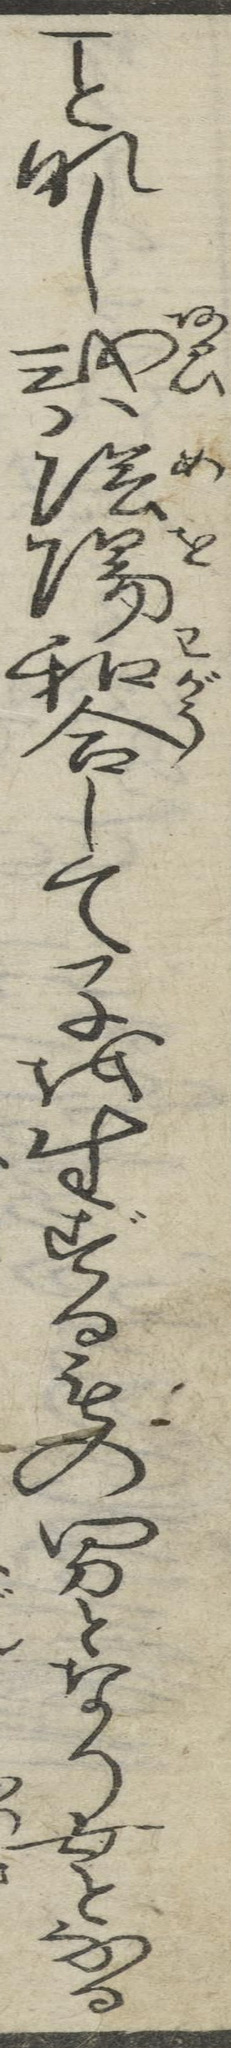ことなし或は陰陽和合して子を生ずるもの男となり女となる
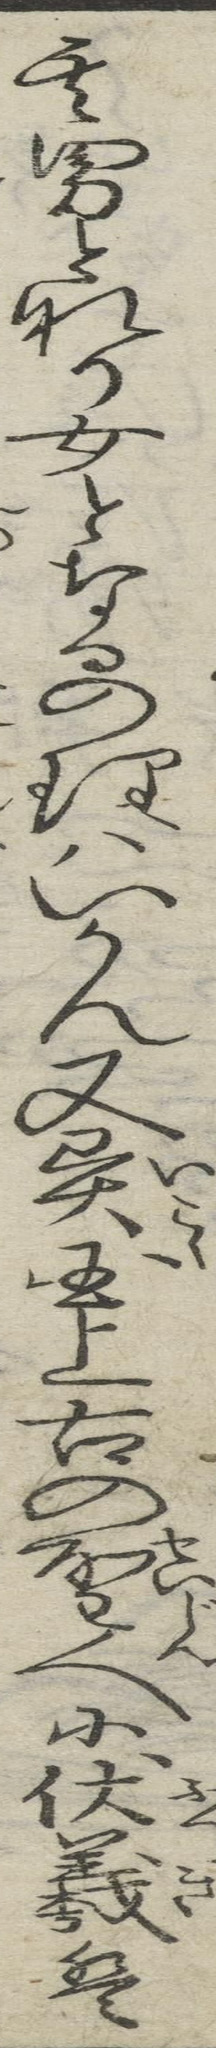其男となり女となるの理はいかん又異国上古の聖人に伏羲は
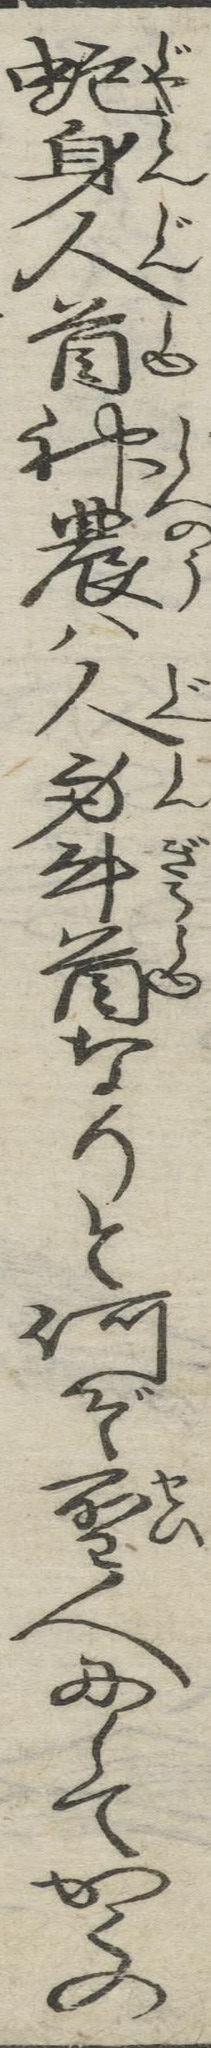蛇身人首神農は人身牛首なりと何ぞ聖人にしてかくの
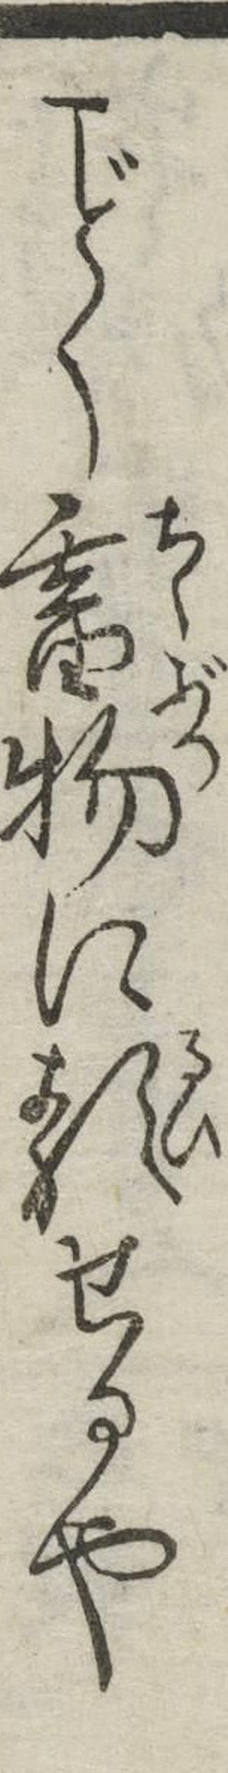ごとく畜物に類せるや
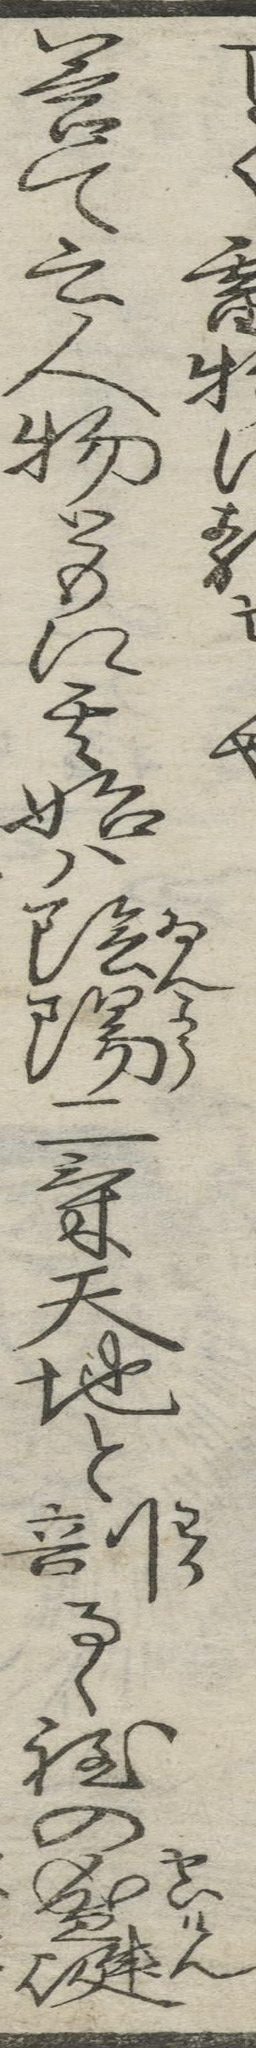答て云人物ともに其始は陰陽二気天地と剖るゝ程の盛健
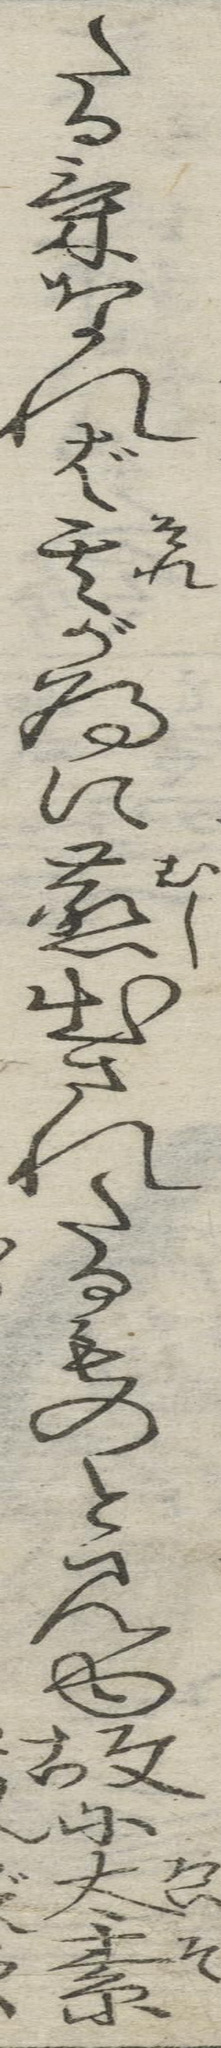たる気なれば其が為に蒸出されたるものと見ゆ故に太素
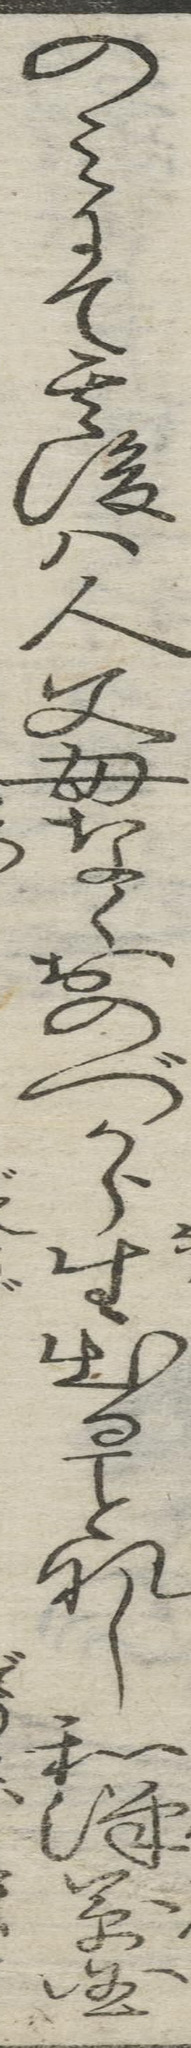のみにて其後は人父母なくおのづから生出ることなし和漢萬国理
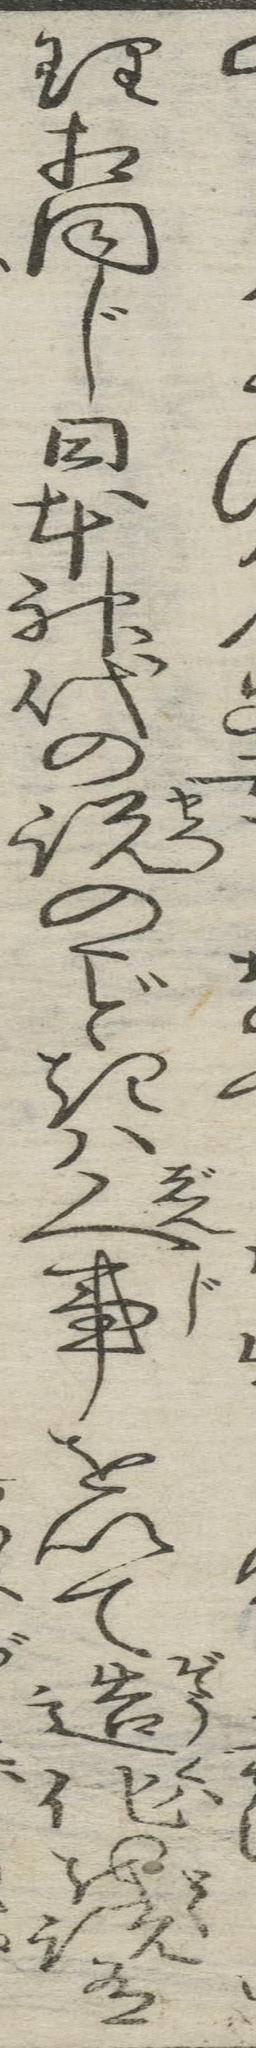相同じ日本神代の説のごときは人事以て造化を説有
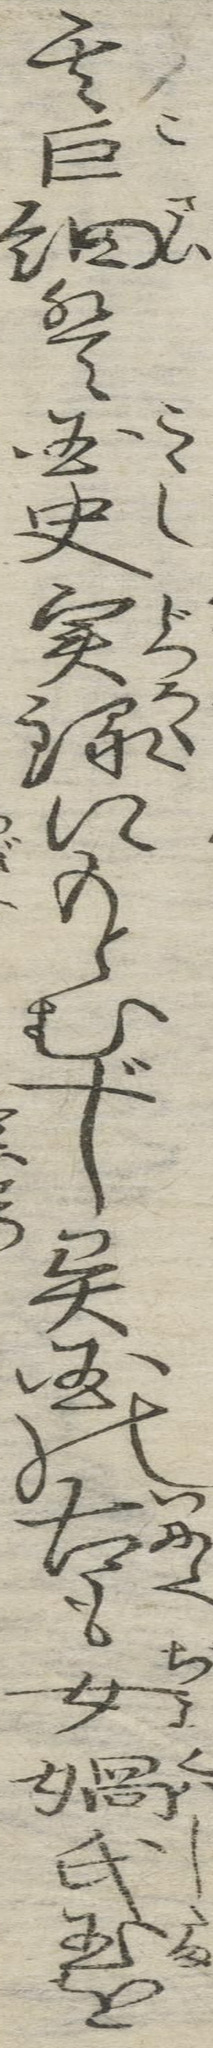其巨細には国史実録にもとむべし異国の古も女媧氏玉を
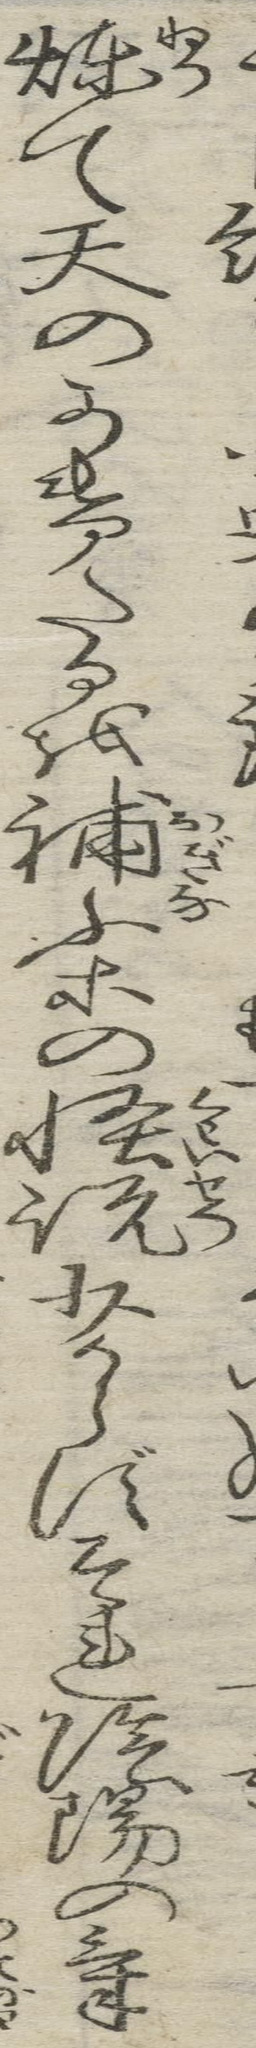練て天のかけたるを補ふ等の怪説少からずそれ陰陽の気
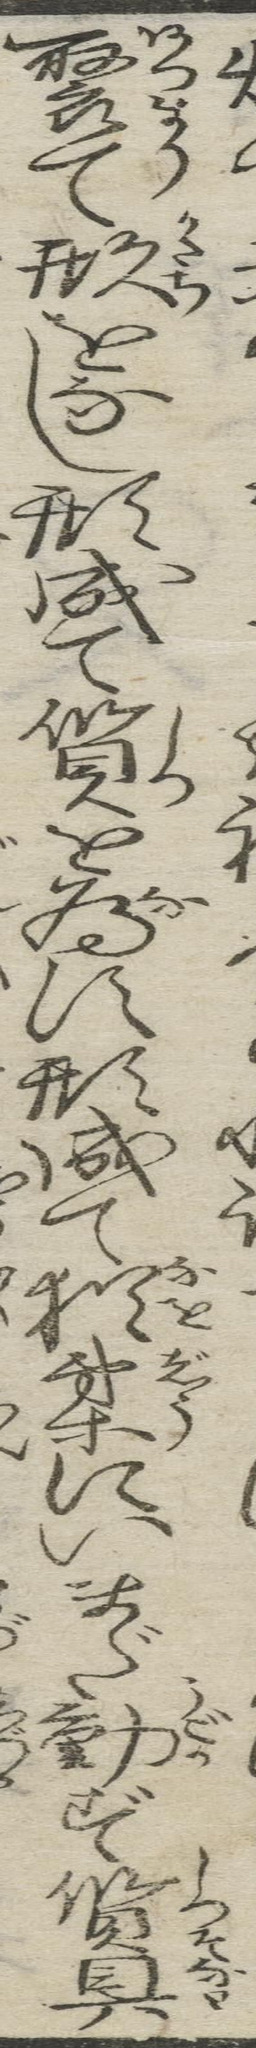聚て形をなし形成て質を為す形成て猶柔にいまだ動ず質具
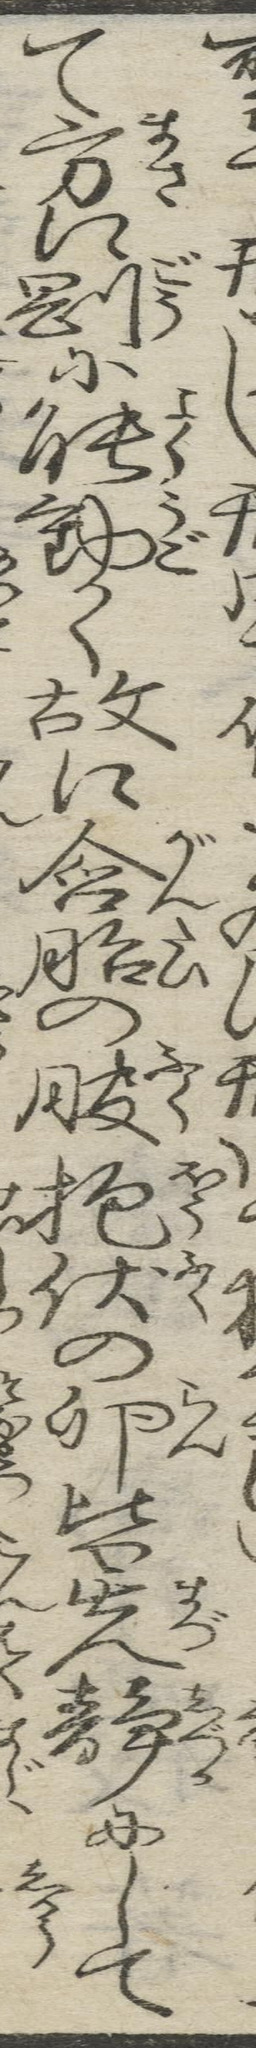て方に剛に能動く故に含胎の腹抱伏の卵皆先静にして
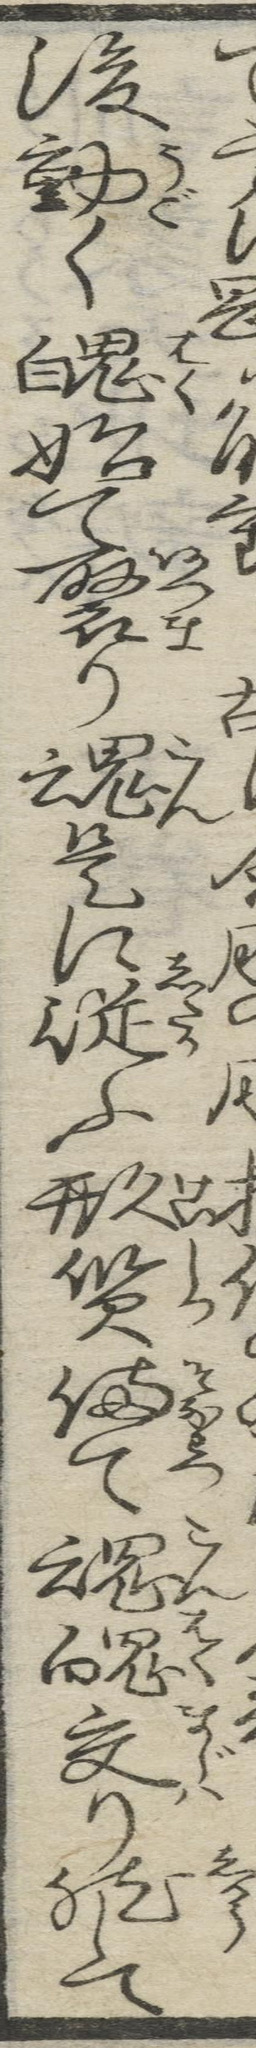後動く魄始て聚り魂是に従ふ形質備て魂魄交り然して
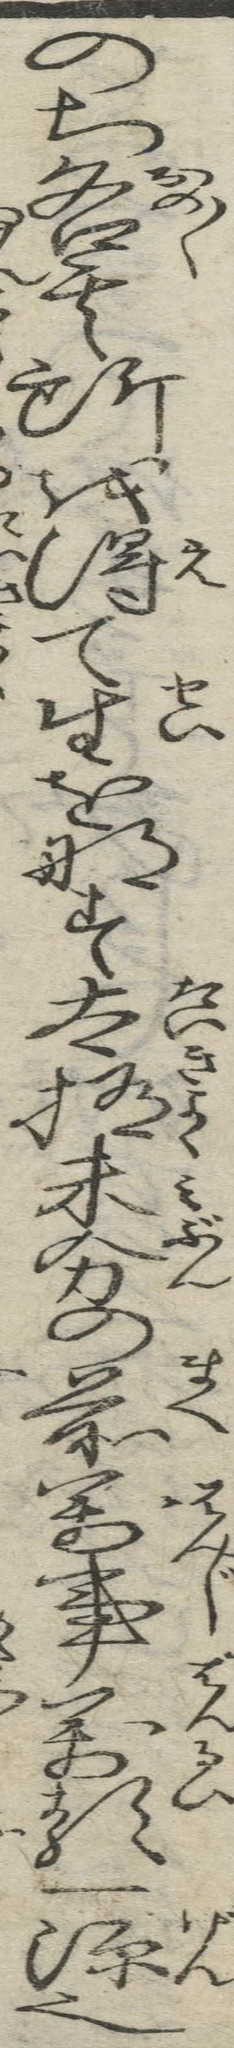のち各其所を得て生をなす太極未分の前萬事萬類一源也
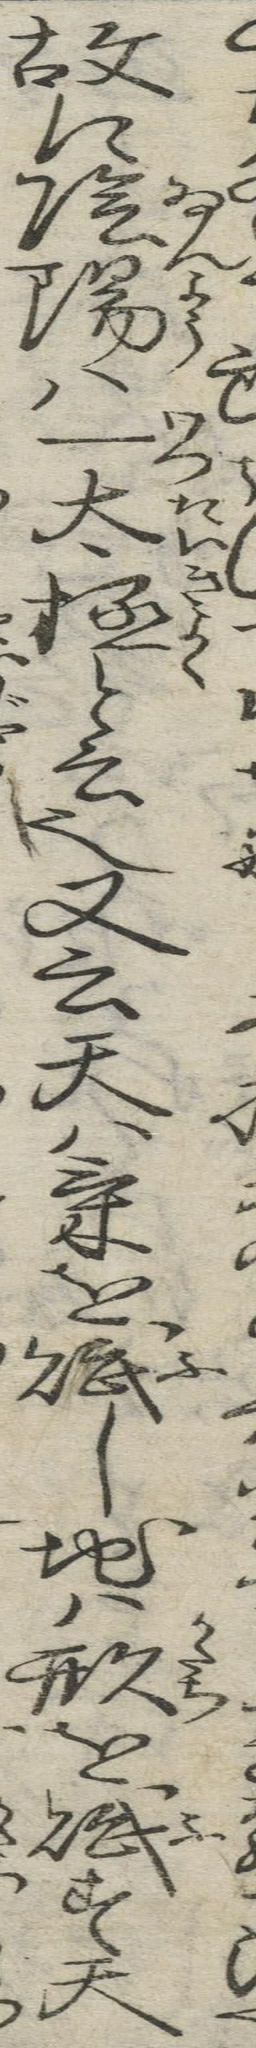故に陰陽は一太極と云也又云天は気を賦し地は形を賦す天
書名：訓蒙天地辨　人
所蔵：東京大学地震研究所図書室 Earthquake Research Institute Library, The University of Tokyo, JAPAN
